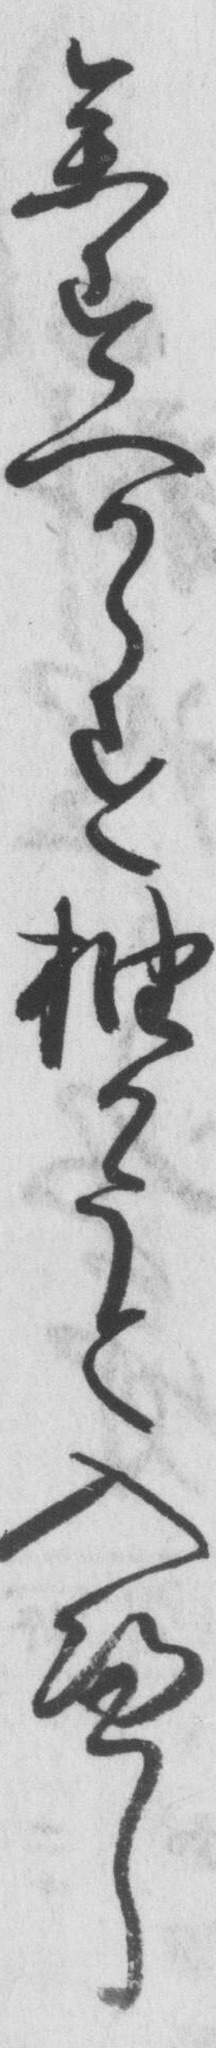参すへからす柚かうと入へし
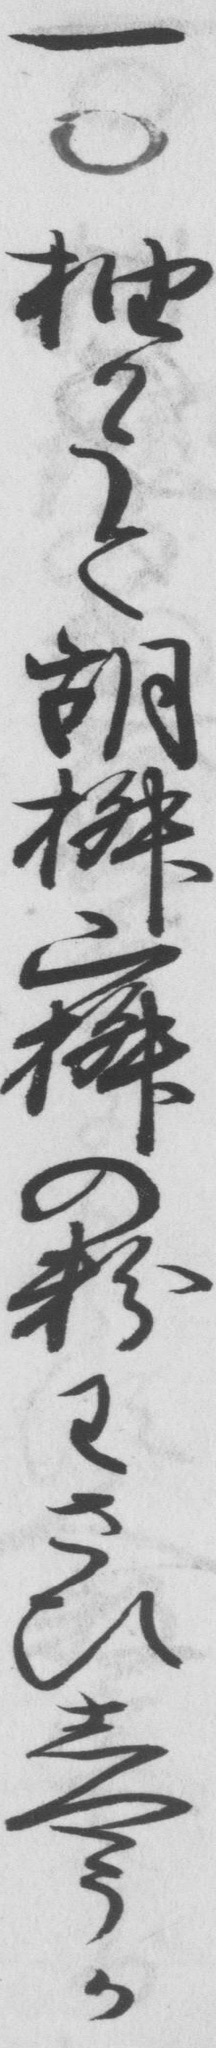一○柚かうと胡椒山椒の粉わさひしやうか
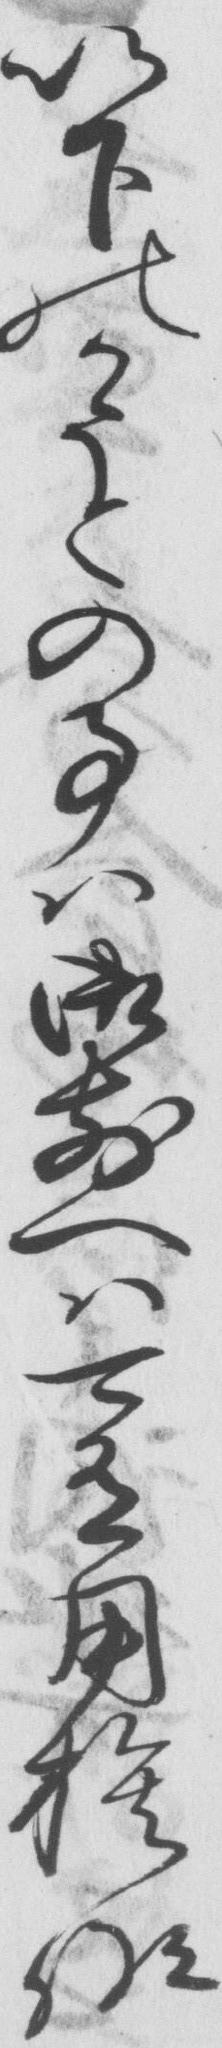以下のかうとの事は御前へは可有用捨候
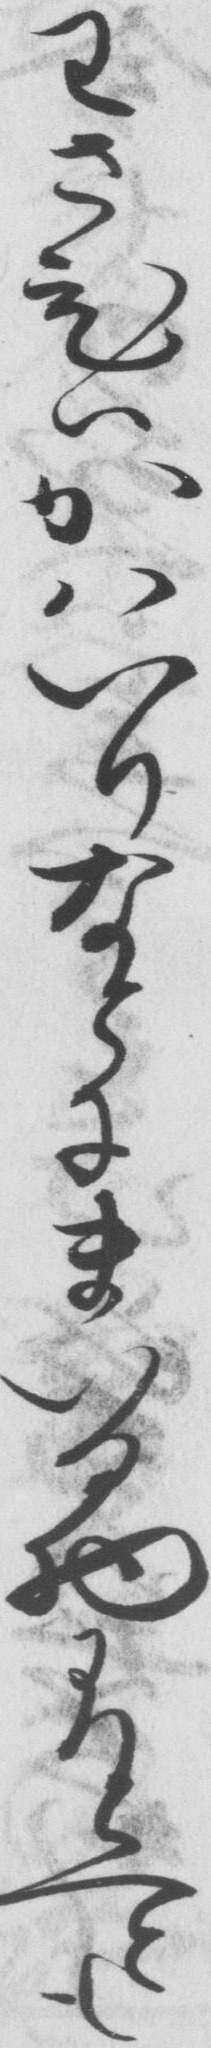わさひはかはいりなとにまいる物に付候へとも
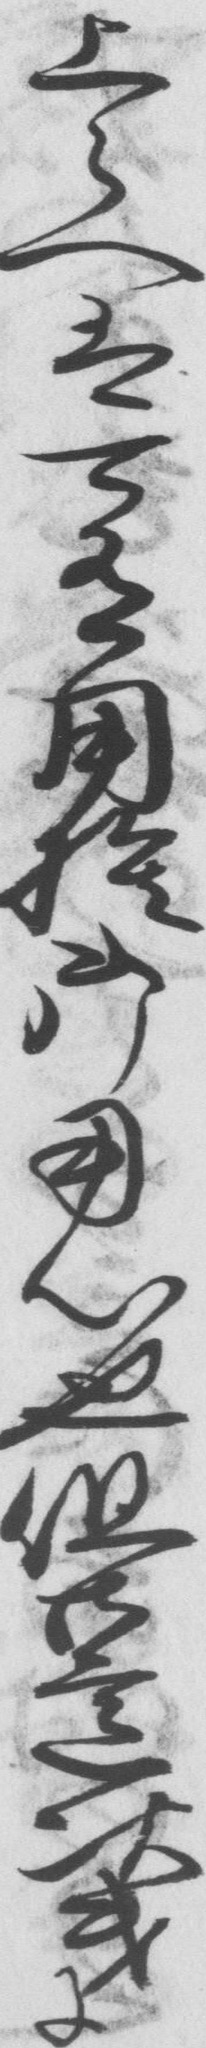上候へは可有用捨御用心也但御意次第に
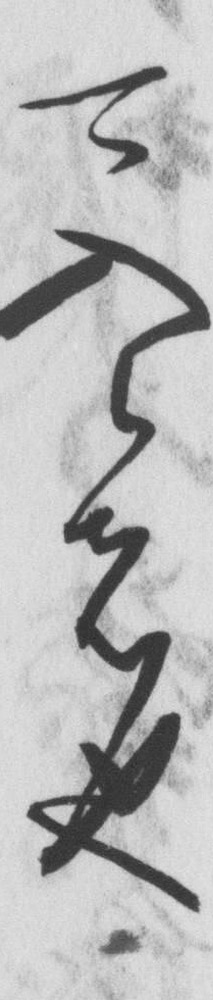可入候者也
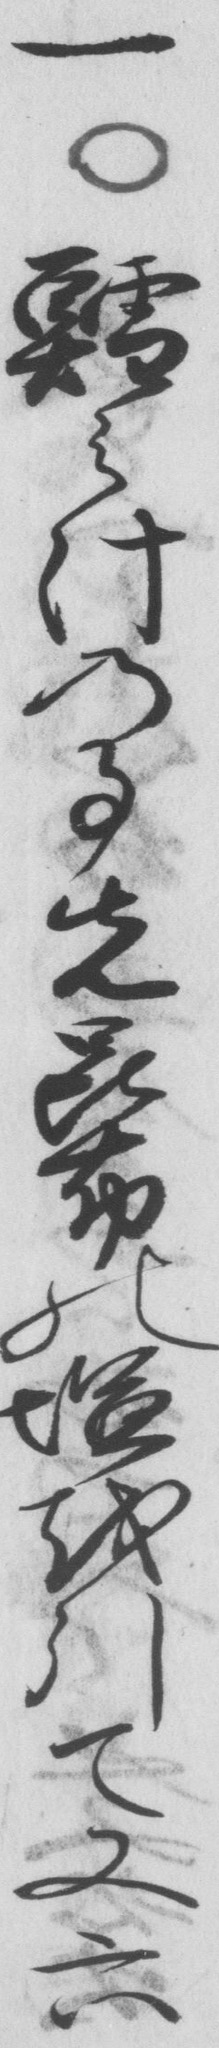一○鱈の汁の事先昆布の塩を引て又六
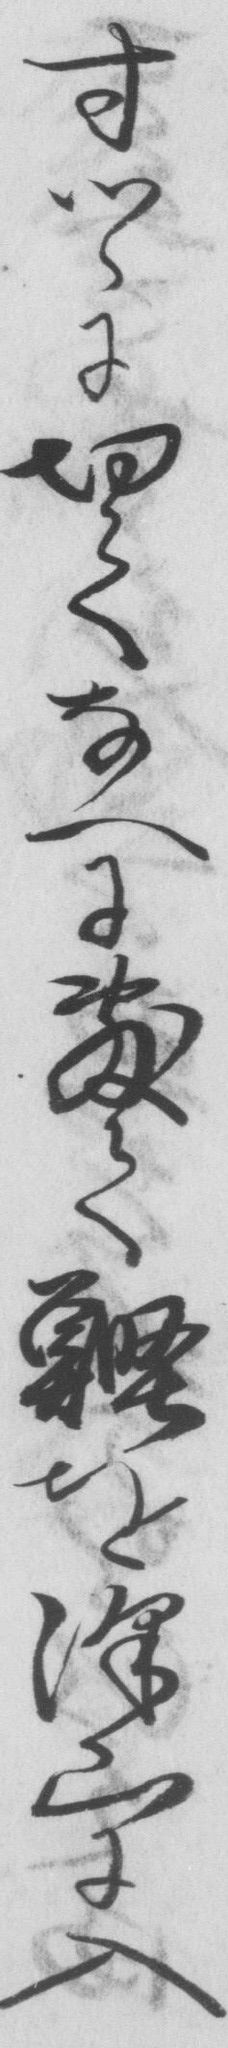寸つゝに切てなへに敷て鰹を沢山に入
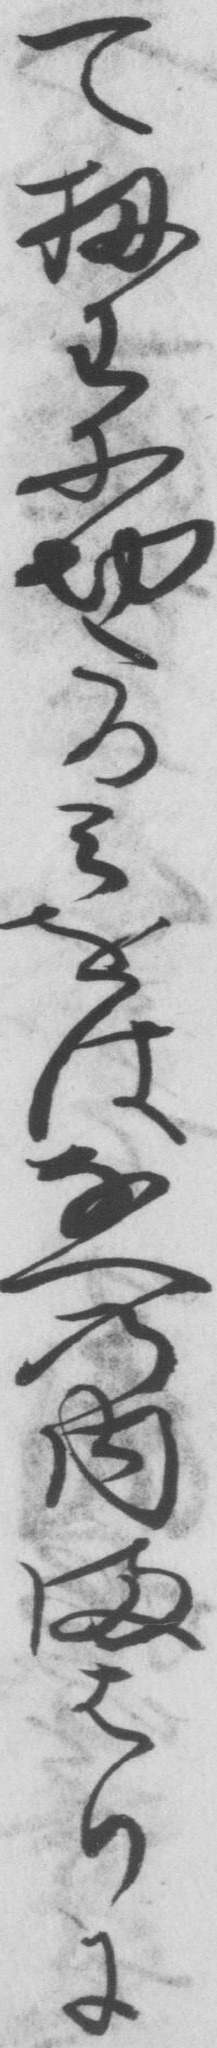て扨わに切たるみをはなへの内まはりに
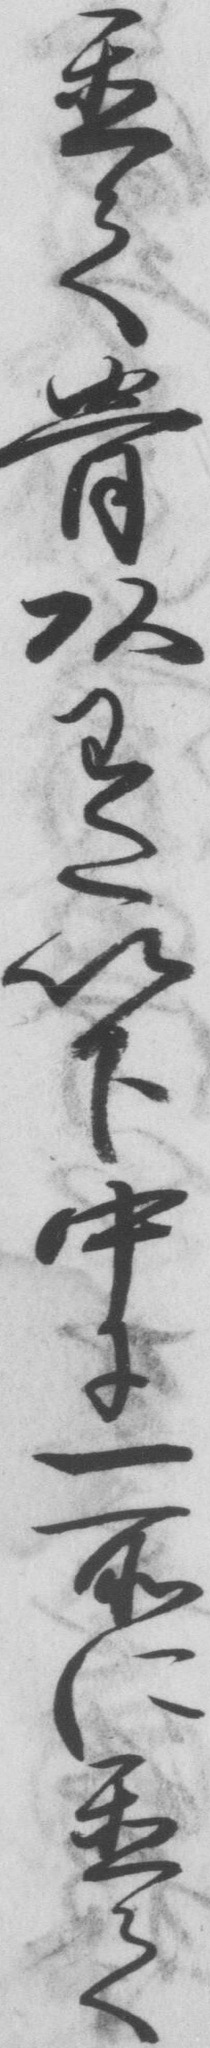置て骨頭わた以下中に一所に置て

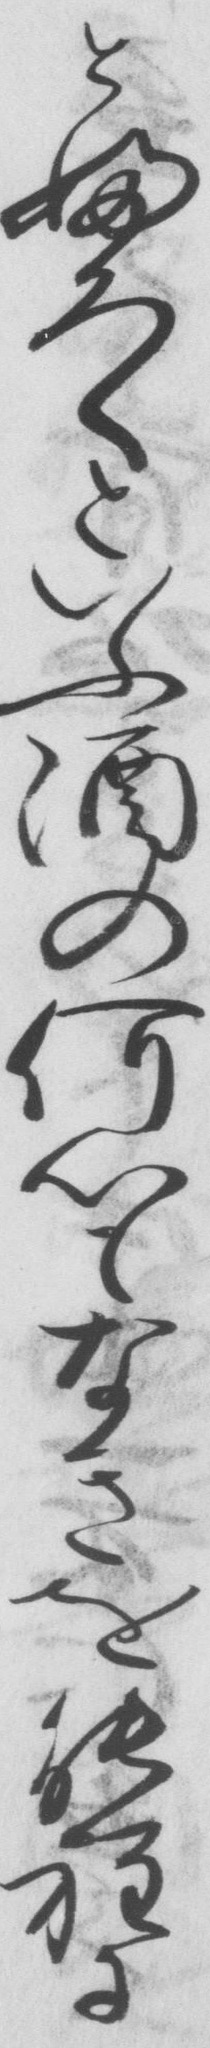とふろくといふ酒の何心もなきを能程に
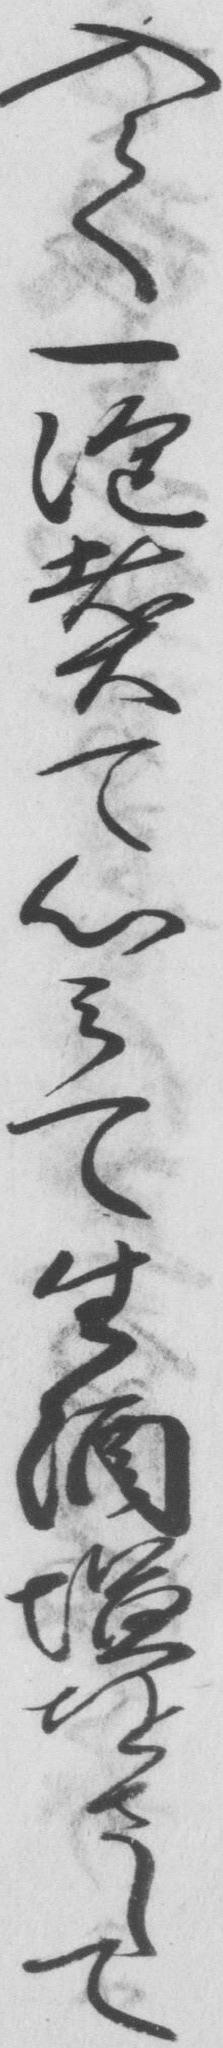入て一泡煮て心みて生酒塩をさして
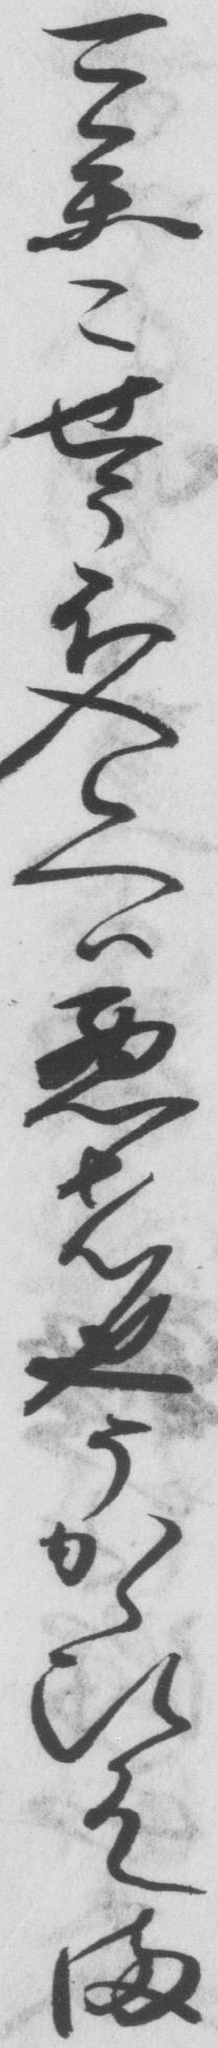可参こせう不入候へは悪者也うかゝひてま
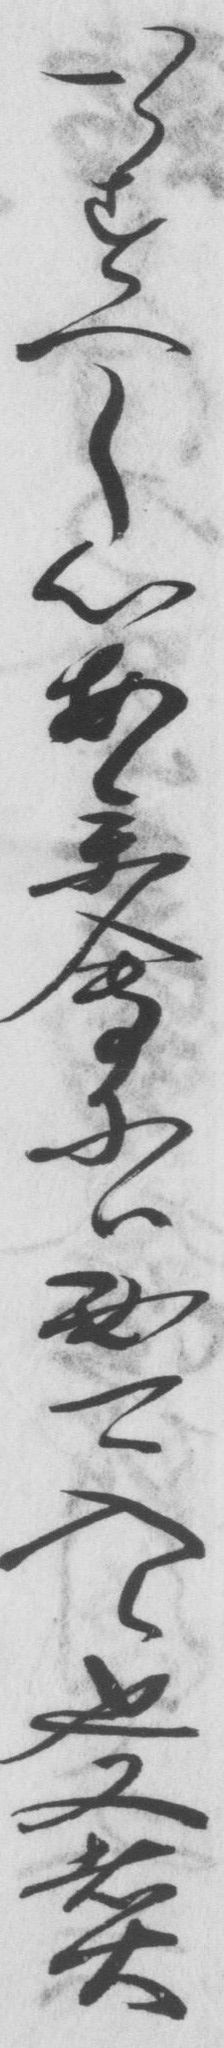いらすへし心安参会には必可入候也又煮
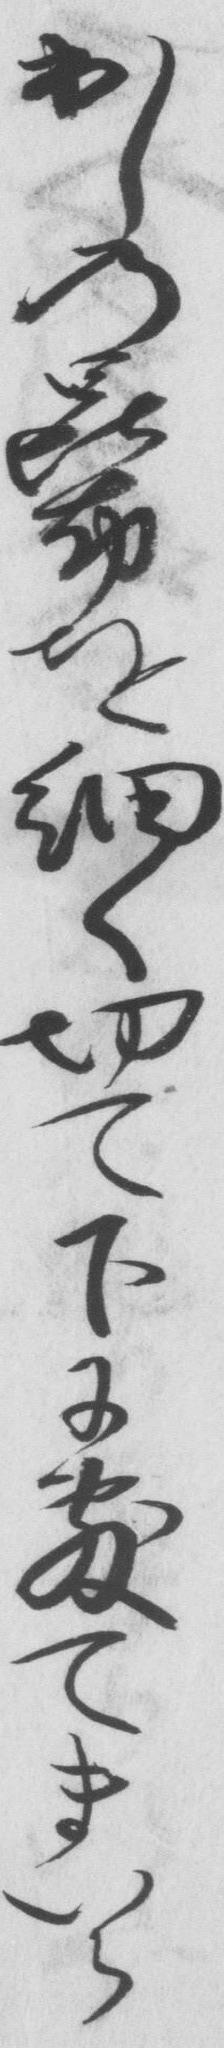出しの昆布を細く切て下に敷てまいら
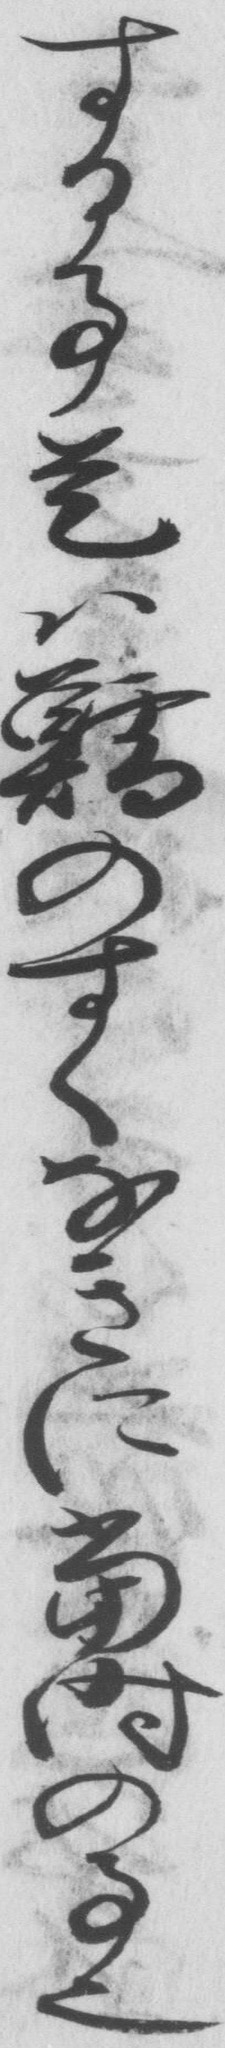する事是は鱈のすくなきに当時の事也
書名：料理次第
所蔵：大阪府立大学学術情報センター 国文学研究資料館
